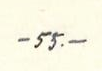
55
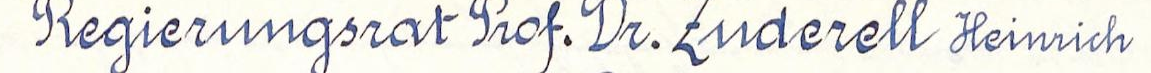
Regierungsrat Prof. Dr. Zuderell Heinrich
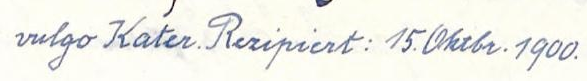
vulgo Kater rez. 15. Oktobr 1900
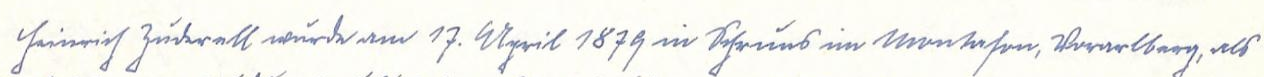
Heinrich Zuderell wurde am 17. April 1879 in Schruns im Montafon, Vorarlberg, als
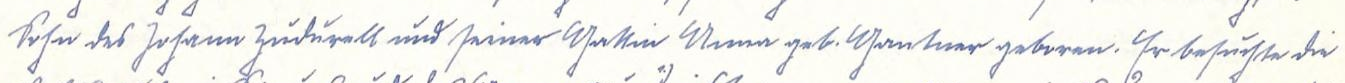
Sohn des Johann Zuderell und seiner Gattin Anna geb. Gantner geboren. Er besuchte die
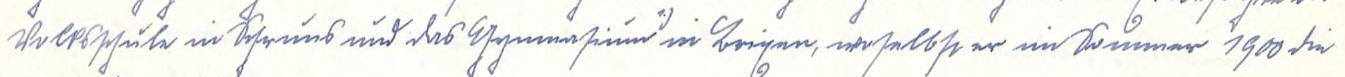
Volksschule in Schruns und das Gymnasium 1) in Brixen, woselbst ein Sommer 1900 die
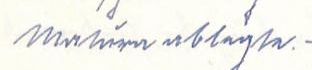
Matura ablegte.-
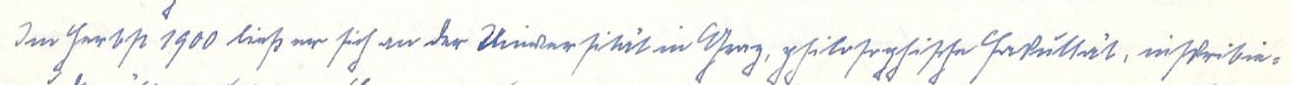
Im Herbst 1900 ließ er sich an der Universität in Graz, philosophische Fakultät, inskribie-
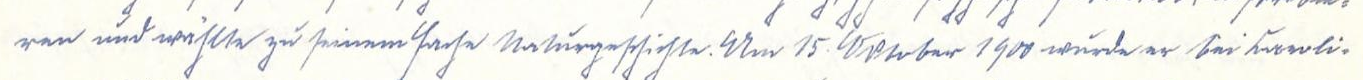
ren und wählte zu seinem Fache Naturgeschichte. Am 15. Oktober 1900 wurde er bei Caroli-
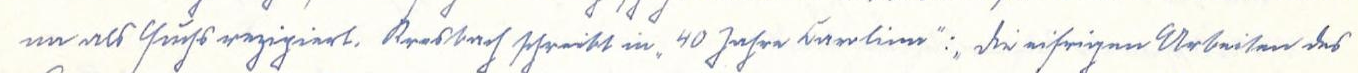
na als Fuchs rezipiert. Kresbach schreibt in „40 Jahre Carolina“: die eifrigen Arbeiten des
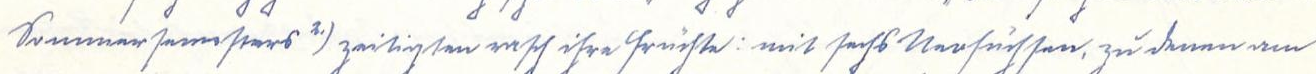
Sommersemesters 2) zeitigten rasch ihre Früchte: mit sechs Neufüchsen, zu denen am
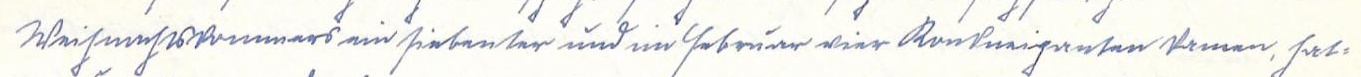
Weihnachtskommers ein siebenter und im Februar vier Konkneipanten kamen, hat-
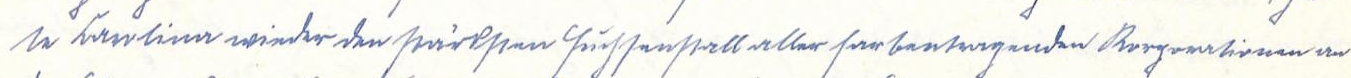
te Carolina wieder den stärksten Fuchsenstall aller farbentragenden Korporationen an
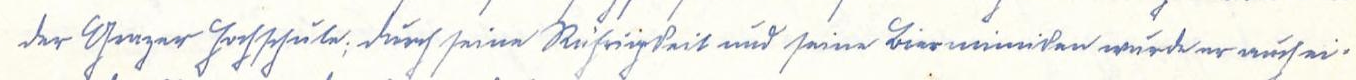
der Grazer Hochschule; durch seine Rührigkeit und seine Biermimiken wurde er auch ei-
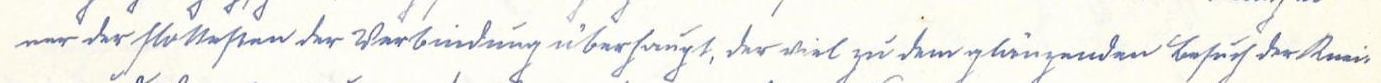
ner der flottesten der Verbindung überhaupt, der viel zu dem glänzenden Besuch der Knei-
